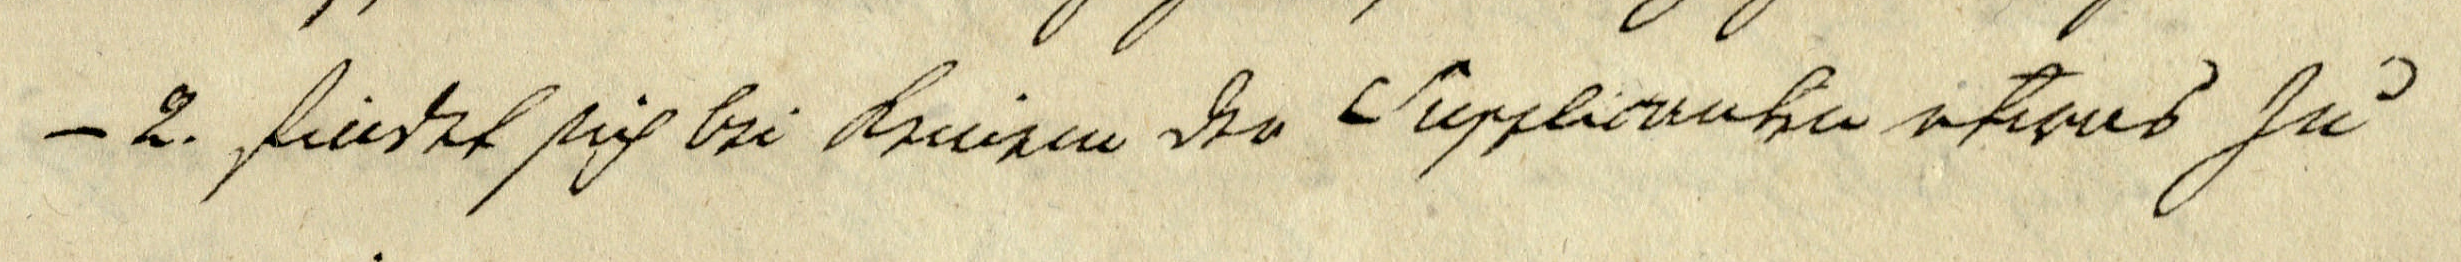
2. findet sich bei keinem der Supplicanten etwas zu
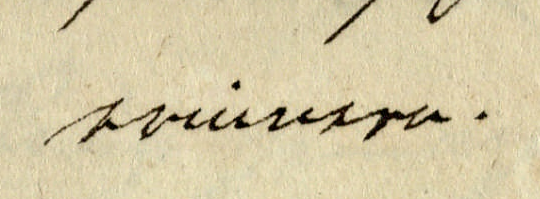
erinnern.
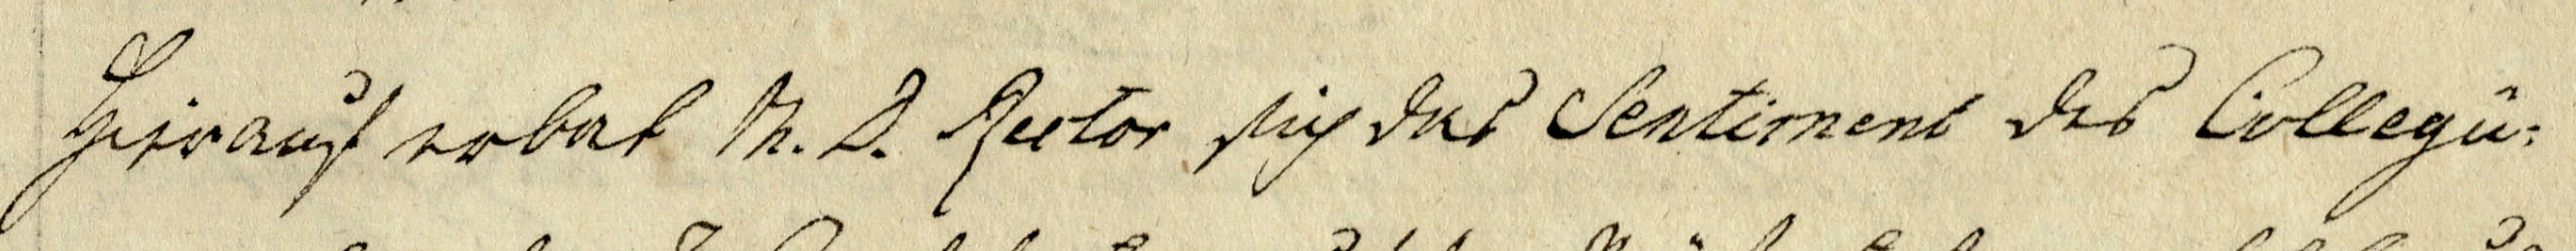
Hierauf erbat M. D. Rector sich das Sentiment des Collegii:
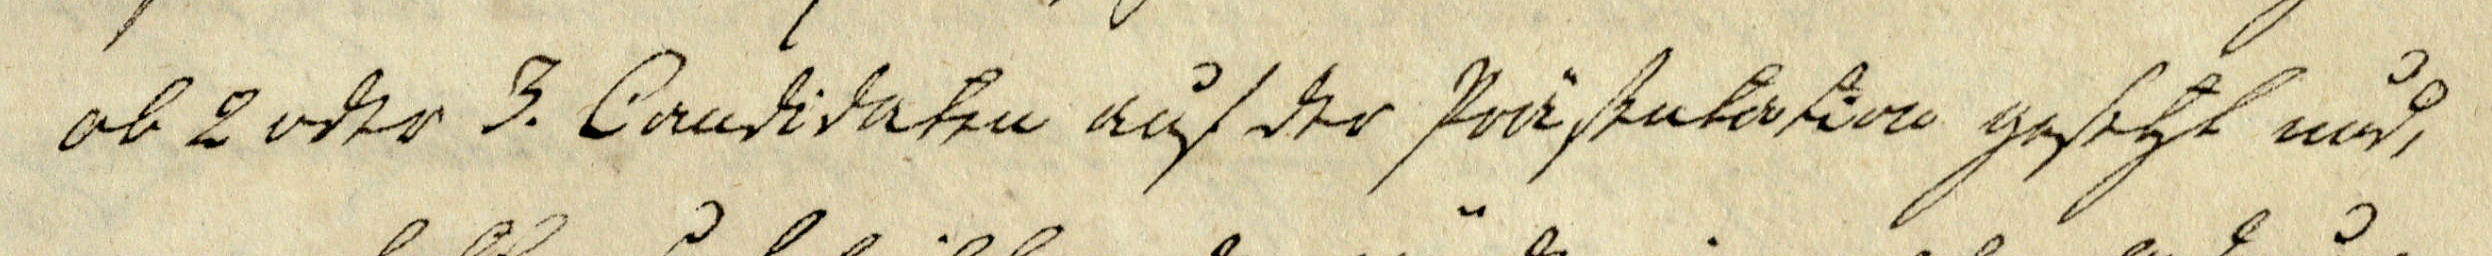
ob 2 oder 3. Candidaten auf der Präsentation gesetzt und,
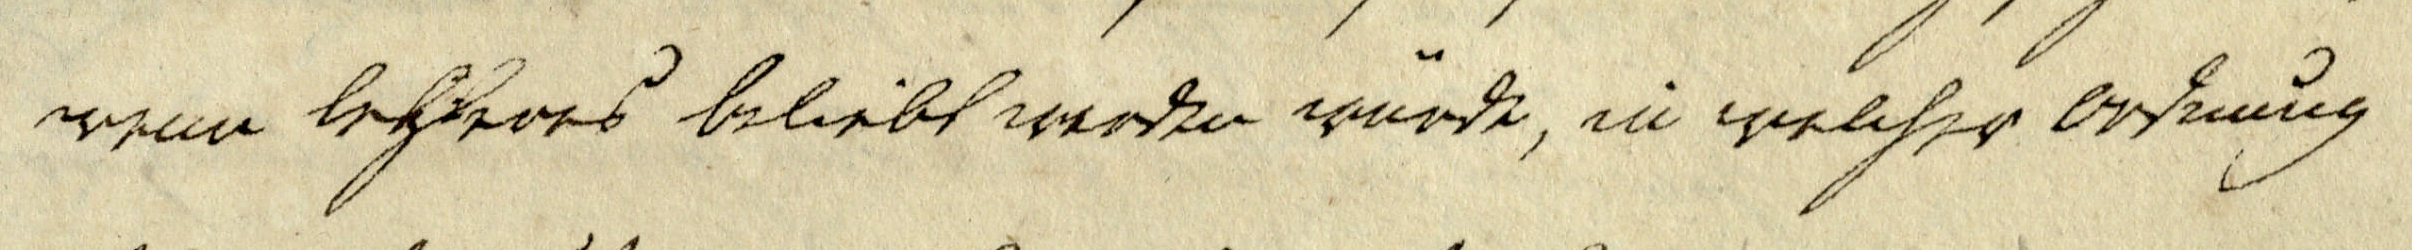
wenn letzteres beliebt werden würde, in welcher Ordnung
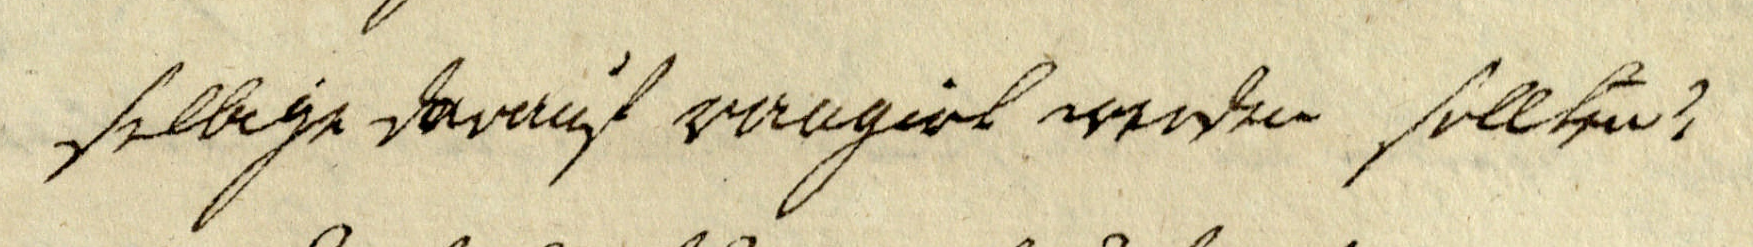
selbige darauf rangirt werden sollten?
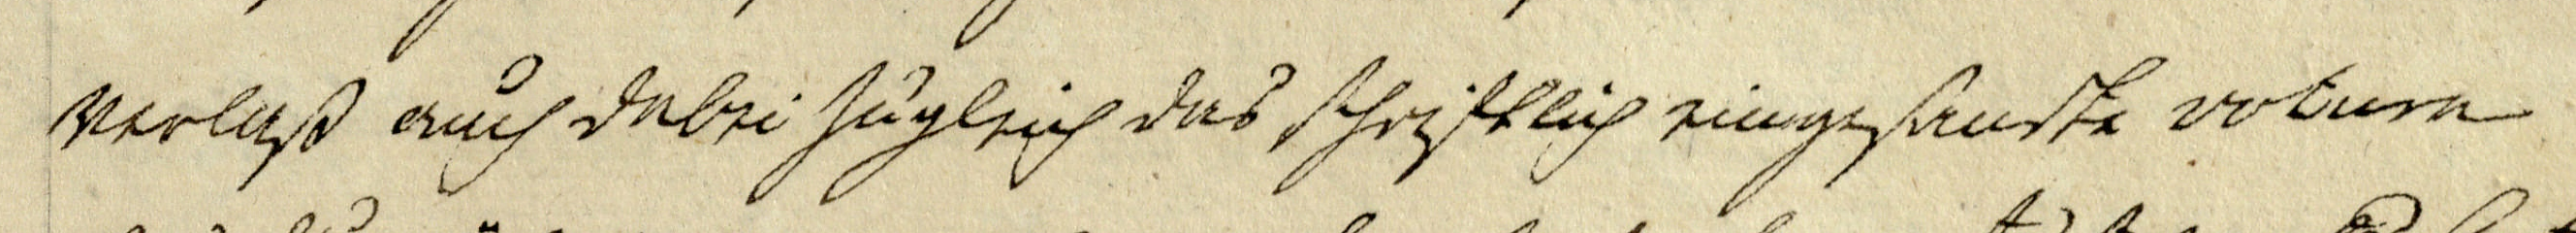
verlaß auch dabei zugleich das schriftlich eingesandte votum
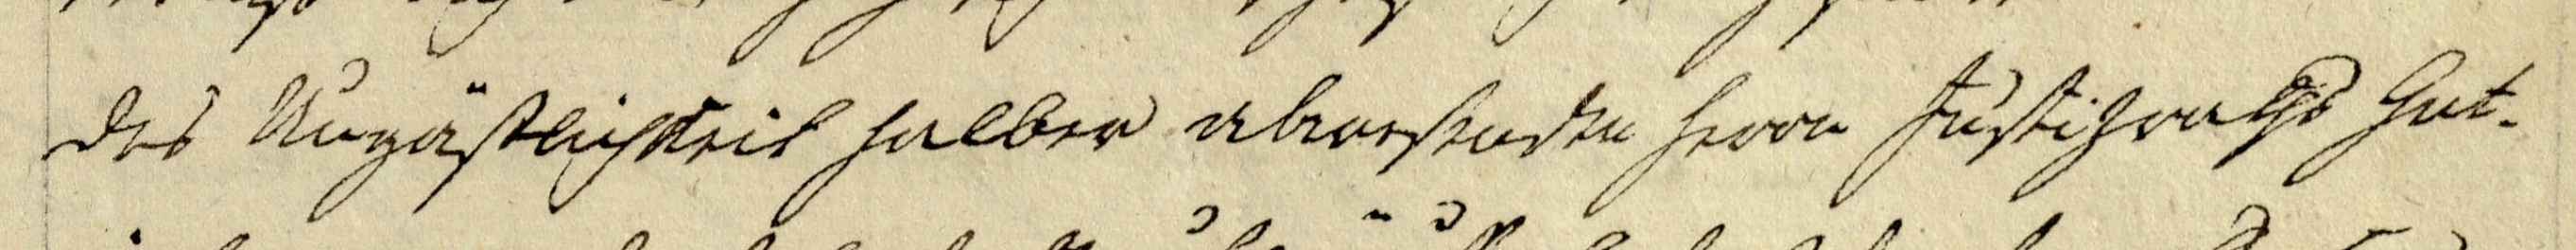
des Unpäßlichkeit halber abwesenden Herrn Justizraths Gut¬
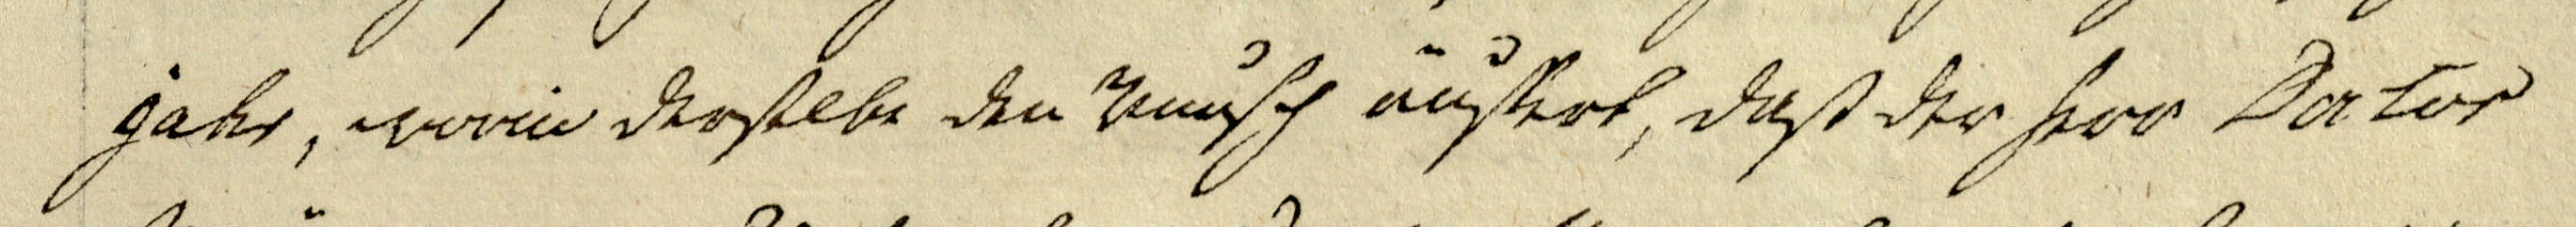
jahr, worin derselbe den Wunsch äussert, daß der Herr Doctor
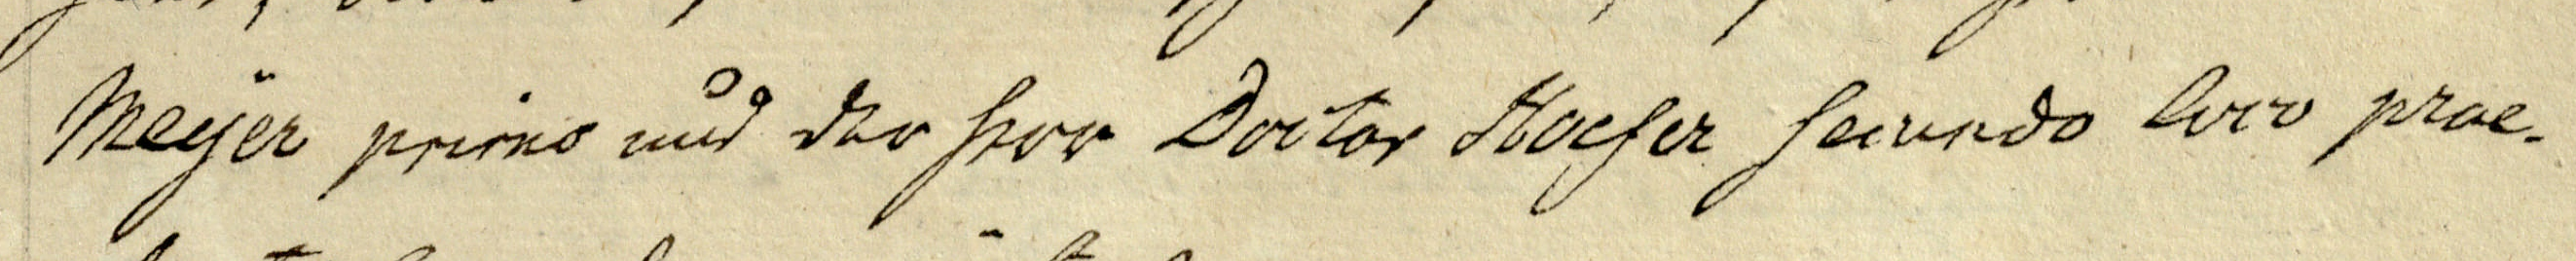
Meÿer primo und der Herr Doctor Hoefer secundo loco prae¬
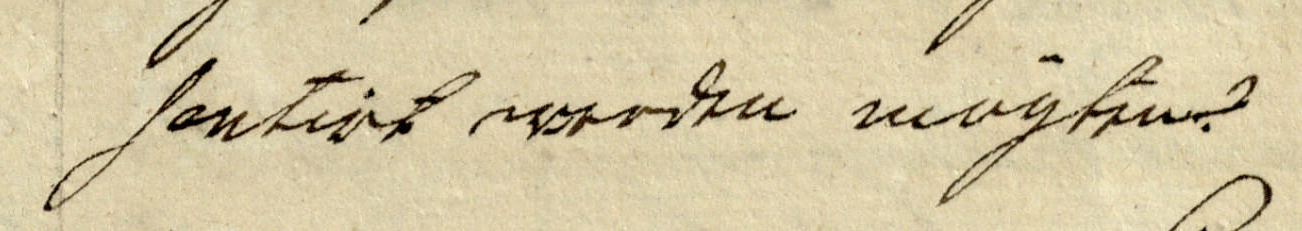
sentirt werden mögten.
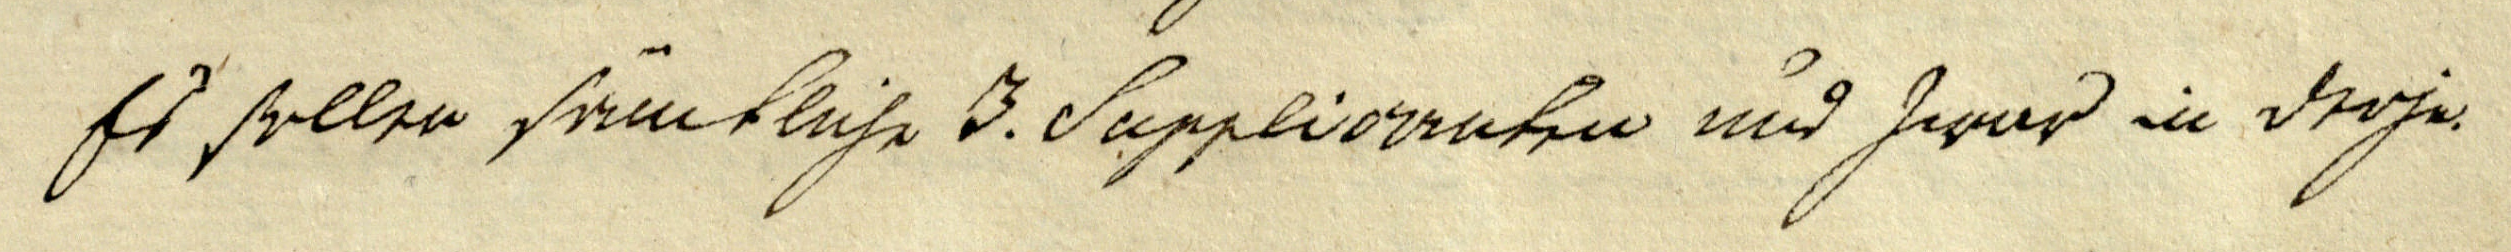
Es sollen sämtliche 3. Supplicanten und zwar in derje¬
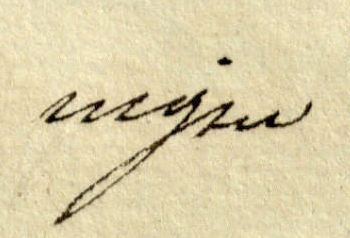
nigen
